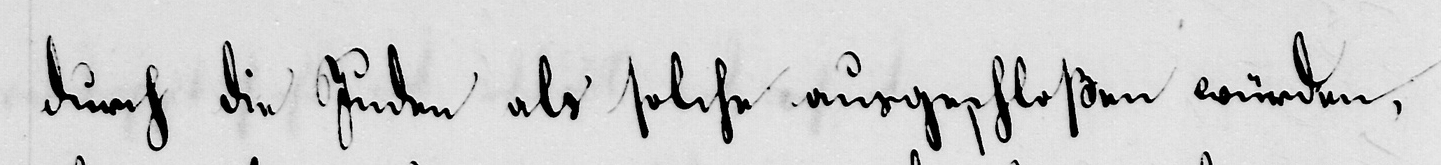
durch die Juden als solche ausgeschloßen würden,
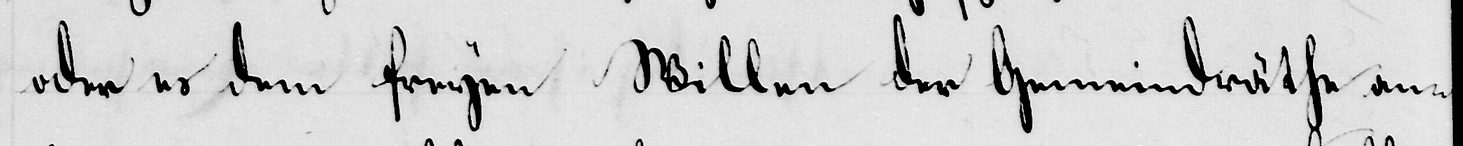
oder es dem freyen Willen der Gemeindräthe an¬
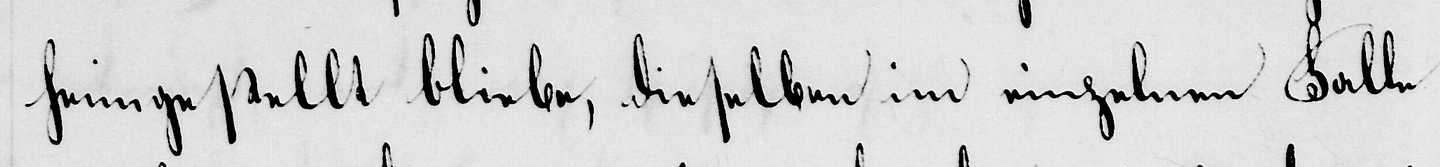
heimgestellt bliebe, dieselben im einzelnen Falle
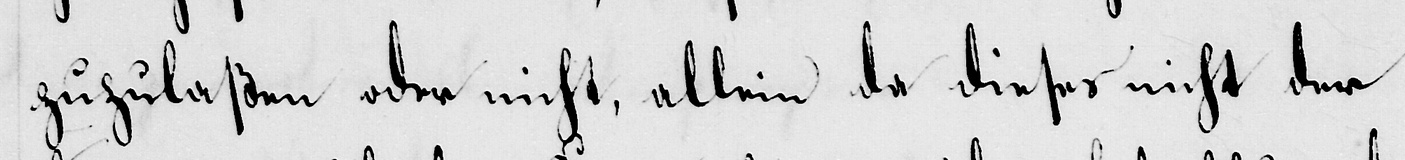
zuzulaßen oder nicht, allein da dieses nicht der
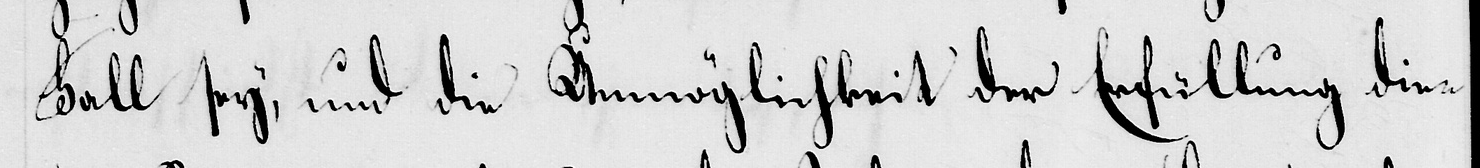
Fall sey, und die Unmöglichkeit der Erfüllung die¬
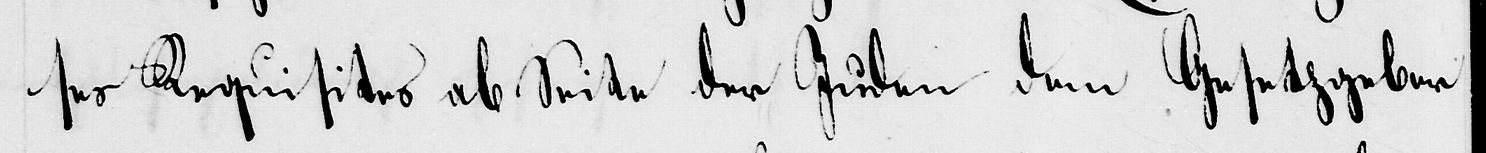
ses Requisites ab Seite der Juden dem Gesetzgeber
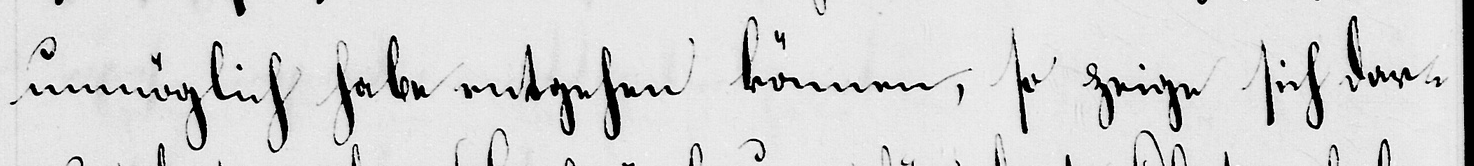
unmöglich habe entgehen können, so zeige sich dar¬
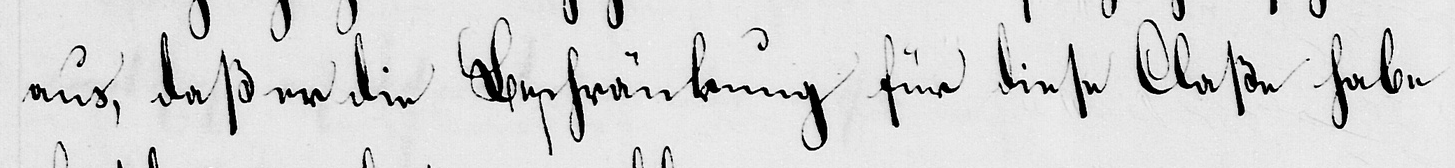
aus, daß er die Beschränkung für diese Claße habe
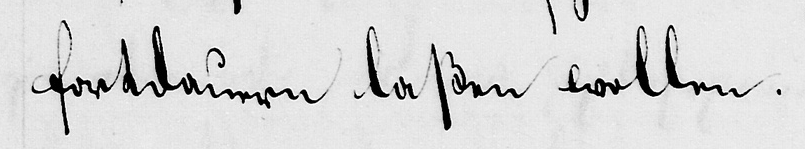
fortdauern laßen wollen.
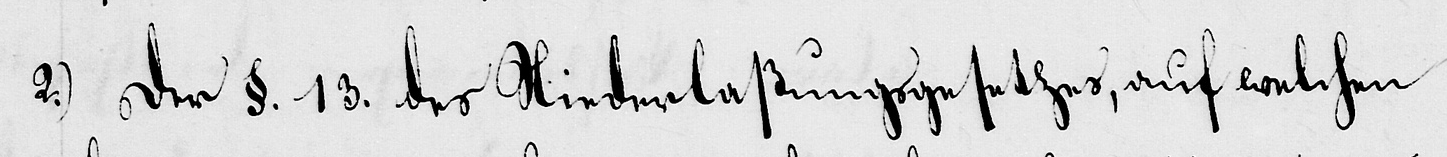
2.) Der §. 13. des Niederlaßungsgesetzes, auf welchen
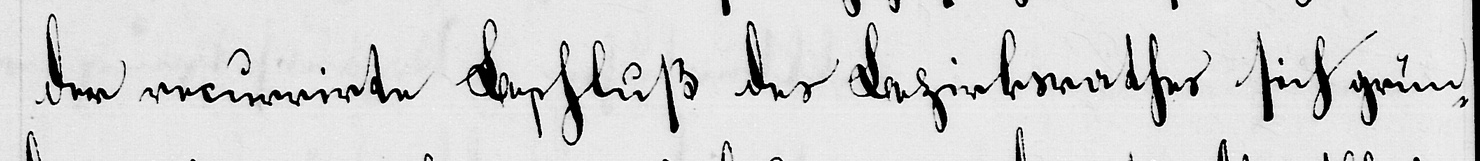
der recurrirte Beschluß des Bezirksrathes sich grün¬
